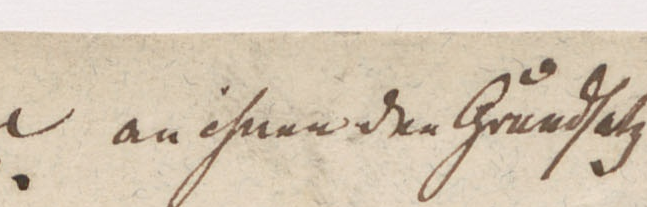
an ihnen den Grundsatz
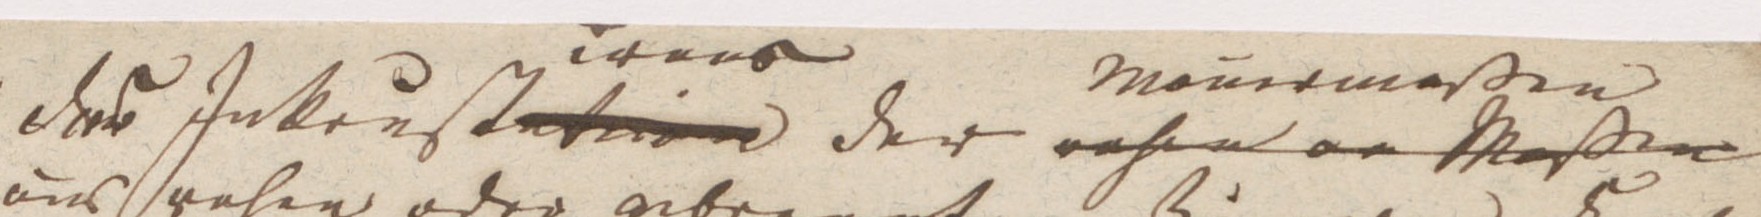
deres Inkrustationiren der nahm an Massen
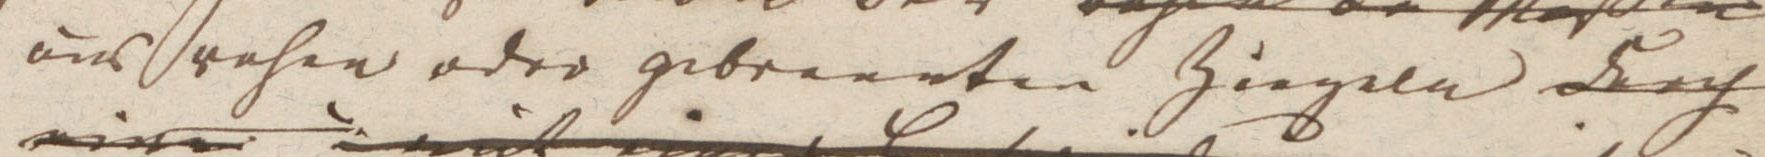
aus rohen oder gebrannten Ziegeln durch
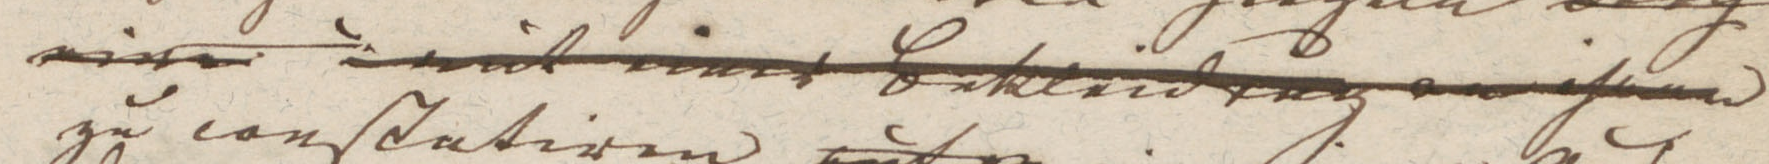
eine mit einer Bekleidung an ihnen
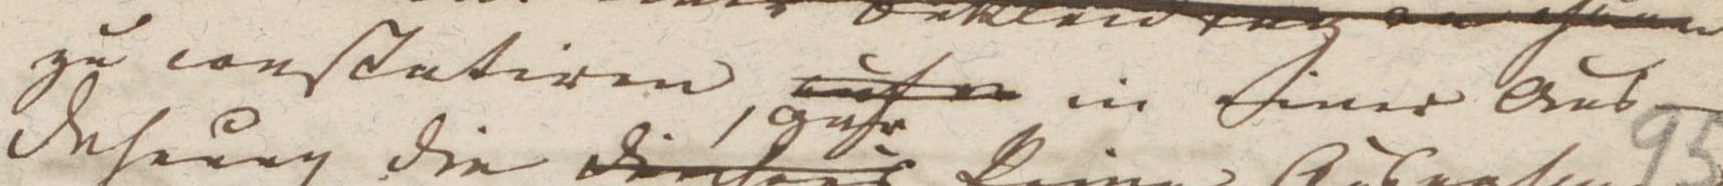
zu constatiren, auf in einer Aus-
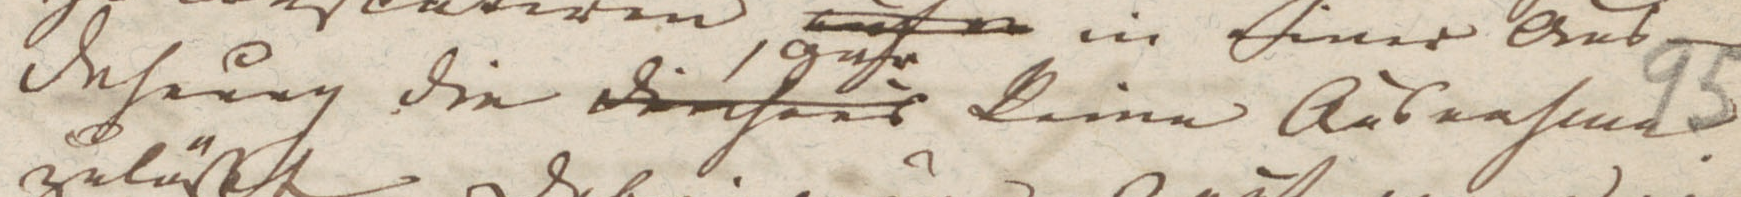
dehnung die durchaus gar keine Ausnahme
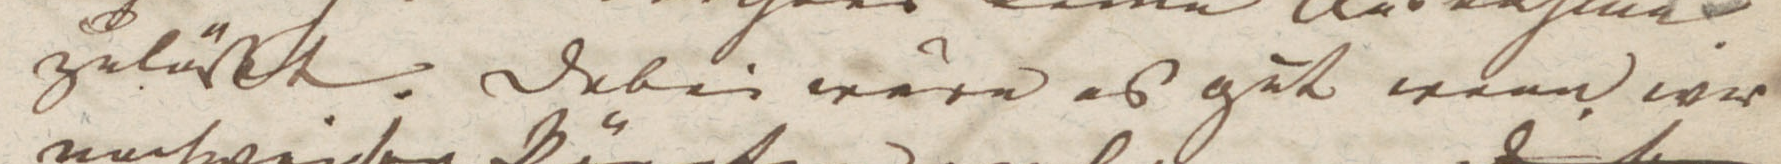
zulässt. Dabei wäre es gut wenn wir
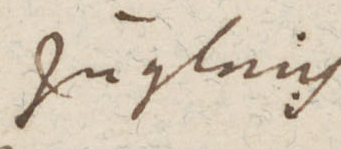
zugleich
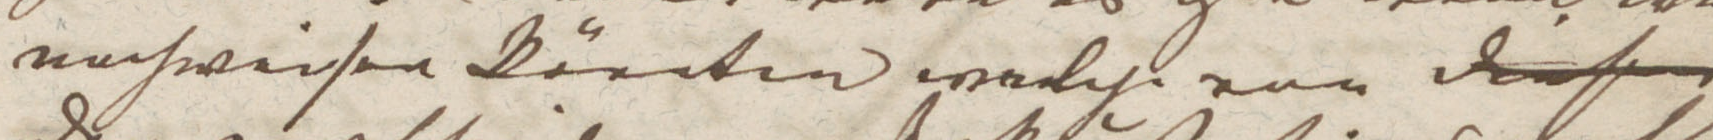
nachweisen könnten welche von diesen
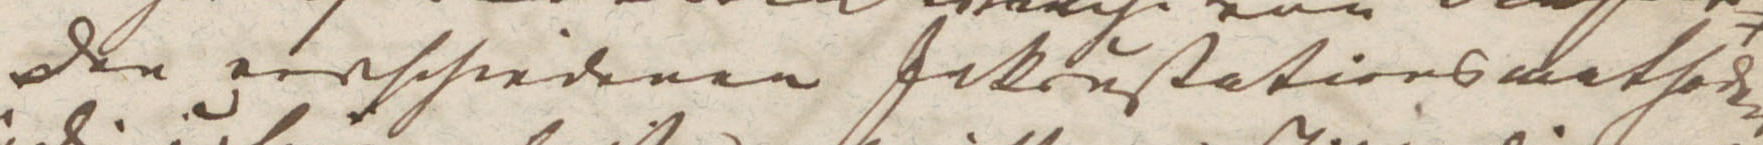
den verschiedenen Inkrustationsmethoden %
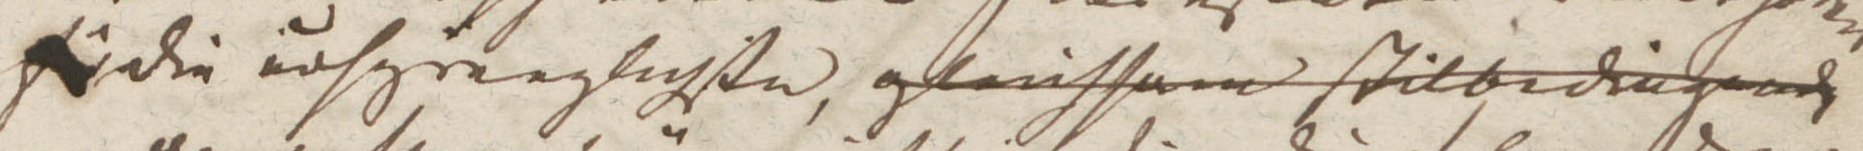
für die ursprünglichste, gleichsam stilbedingende
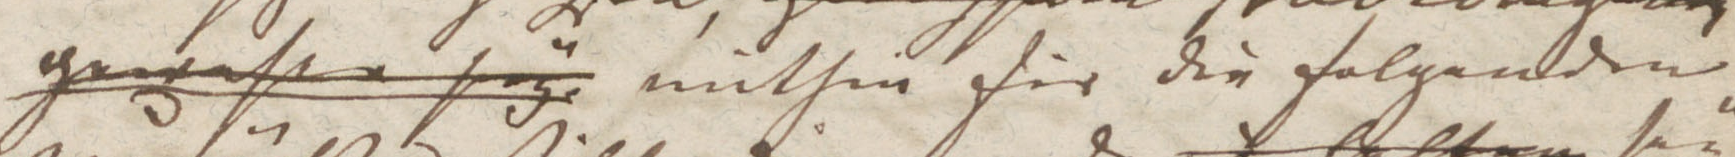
gewesen sey mithin für die folgenden
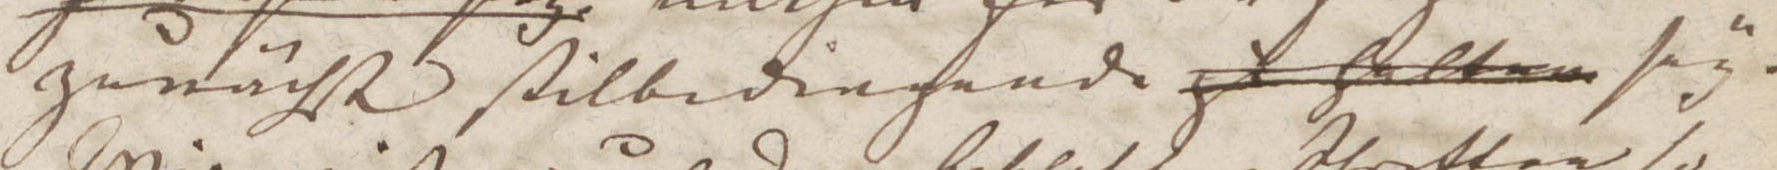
zunächst stilbedingende zu halten sey.
